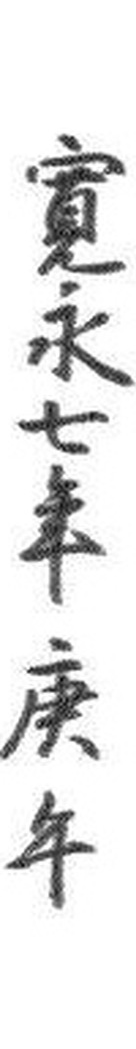寛永七年庚午
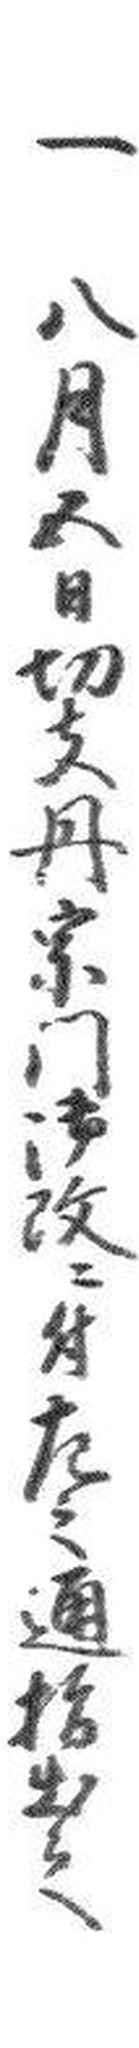一八月五日切支丹宗門御改ニ付左之通指出之
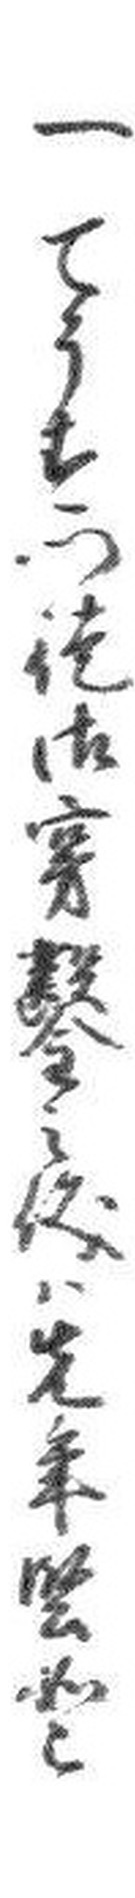一てうす門徒御穿鑿之儀ハ先年堅如被
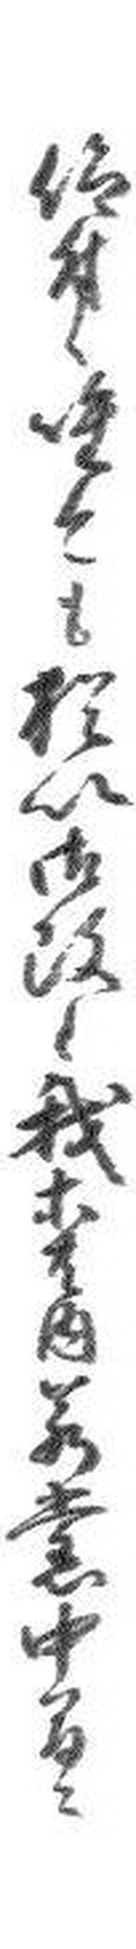仰付候唯今も猶以御改候我等共内若党中間ニ
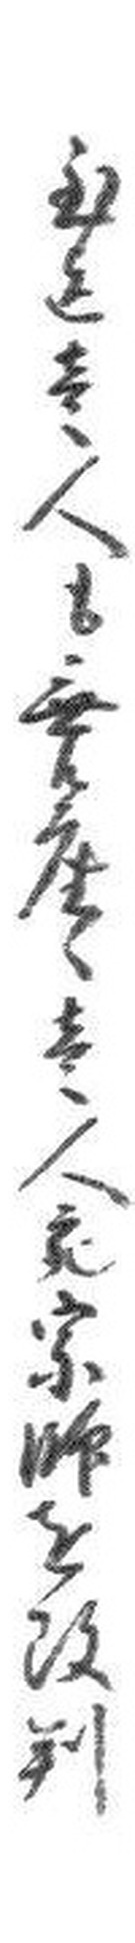至迄壱人も無御座候壱人宛宗師を改判
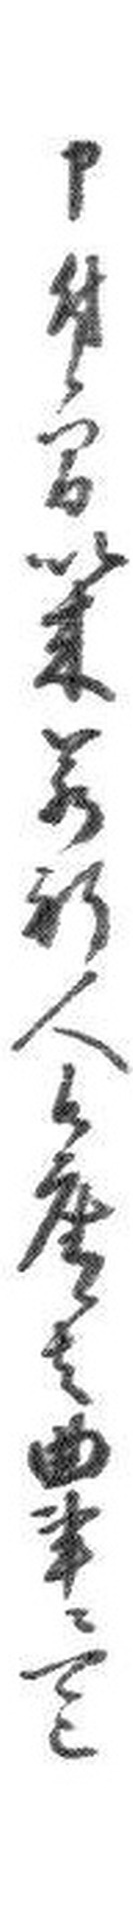申付候間以来若祈人御座候は曲事ニ可被
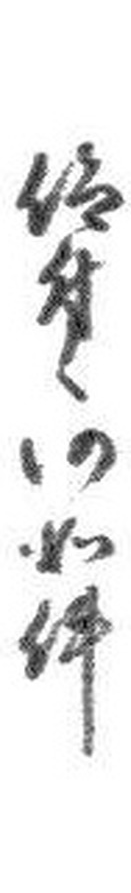仰付候仍如件

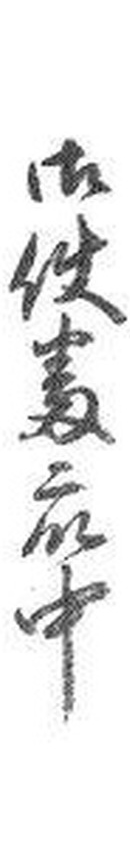御使番衆中
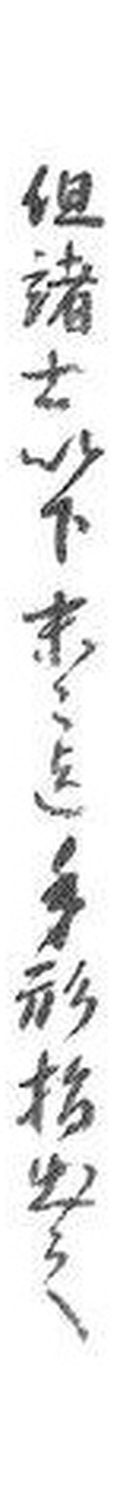組諸士以下末々迄手形指出之
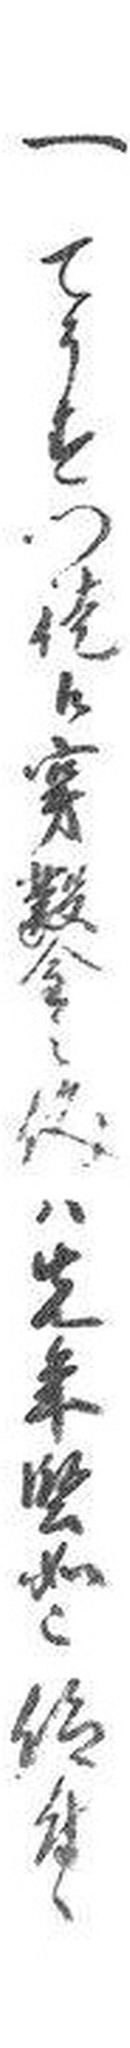一てうす門徒御穿鑿之儀ハ先年堅如被仰付候
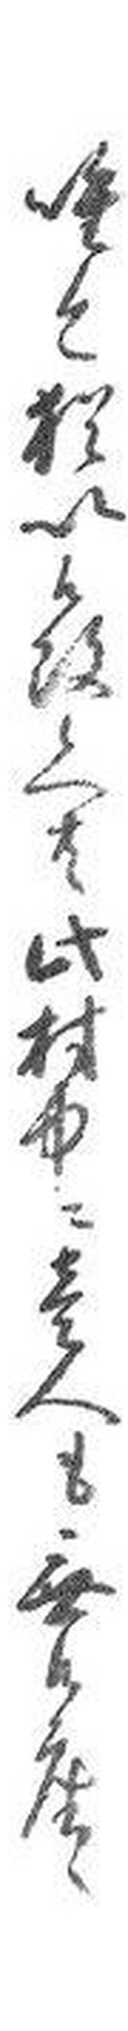唯今猶以御改候へ共此村中ニ壱人も無御座候
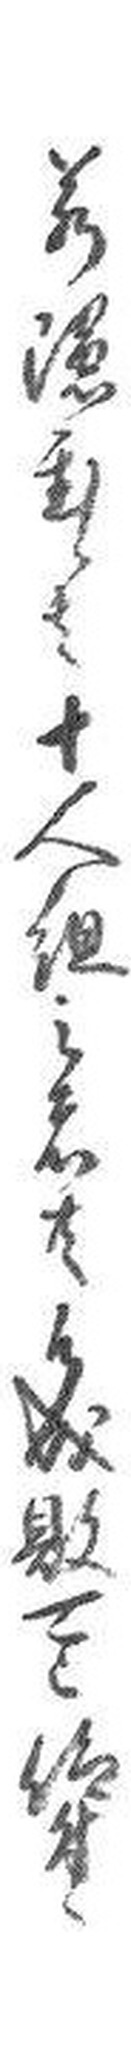若隠置候は十人組之者共御成敗可被仰付候
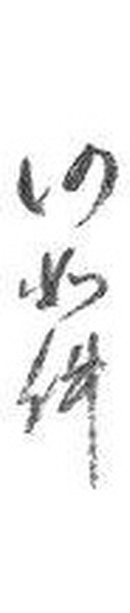仍如件
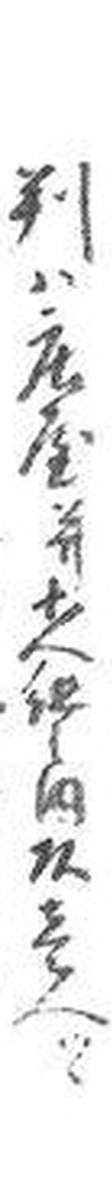判ハ庄屋并十人組之内頭壱人ツゝ
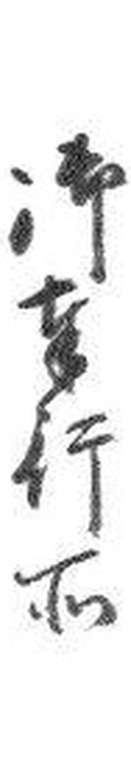御奉行所
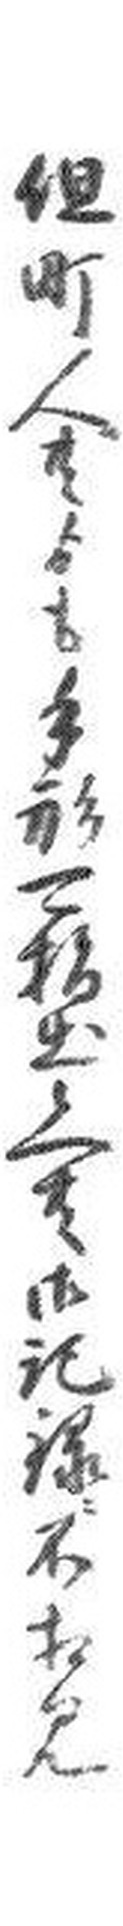但町人共ゟも手形可指出候へ共御記録ニ不相見
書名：家譜 四 忠昌公 従寛永七年到正保四年
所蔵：福井県文書館 Fukui Prefectural Archives
